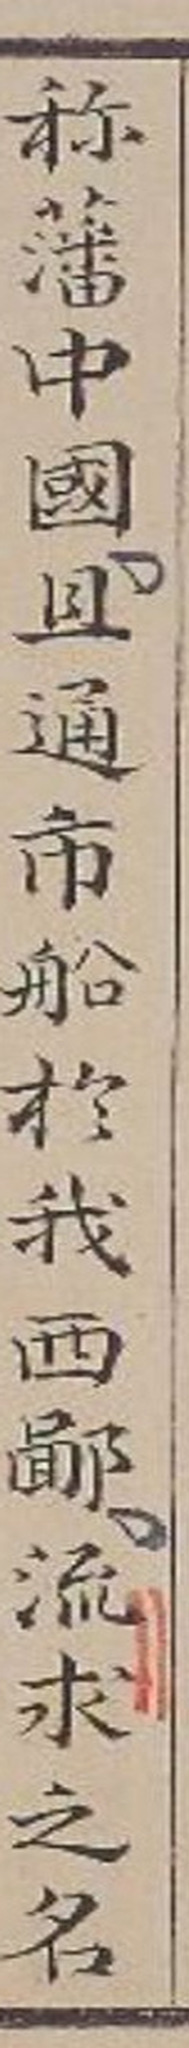称藩中国。且通市船於我西鄙。流求之名
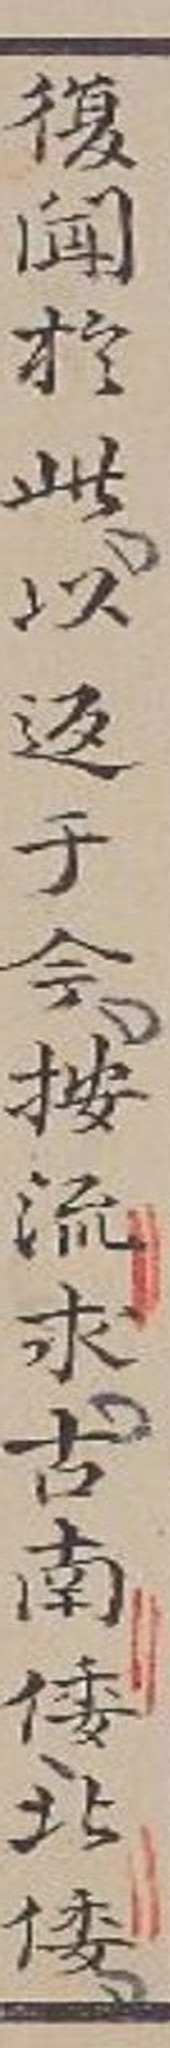復聞於此。以返于今。按流求。古南倭、北倭。
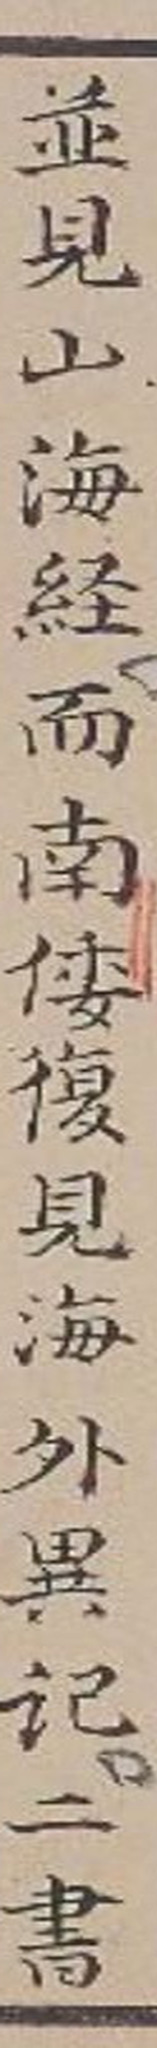並見山海経。而南倭復見海外異記。二書
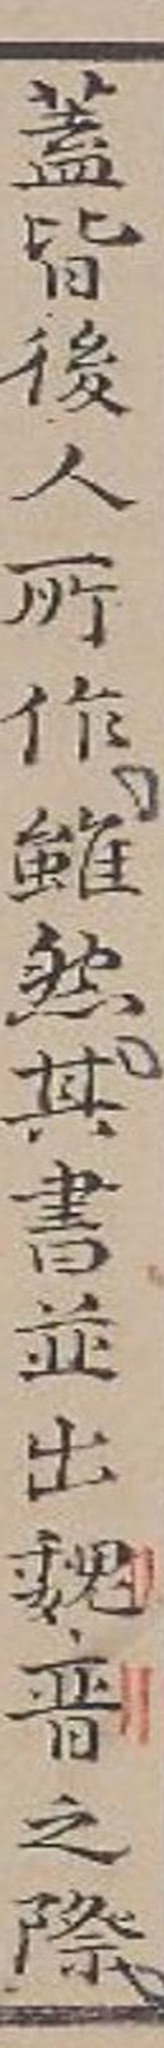蓋皆後人所作。雖然。其書並出魏・晋之際。
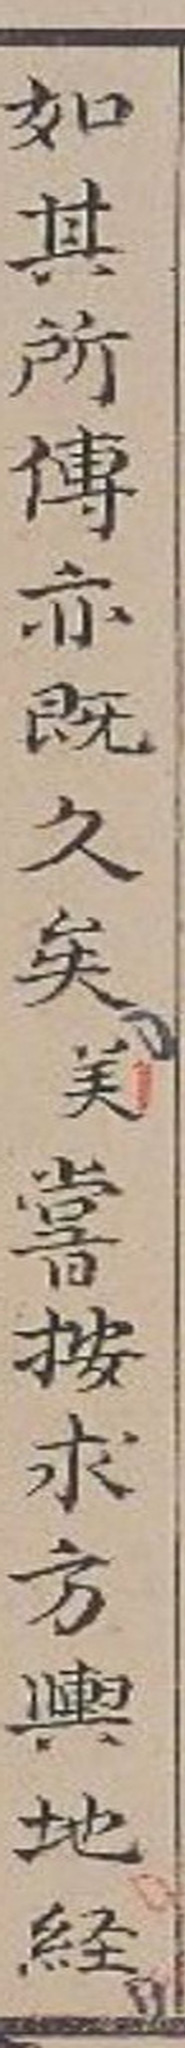如其所伝亦既久矣。美嘗按求方輿地経。
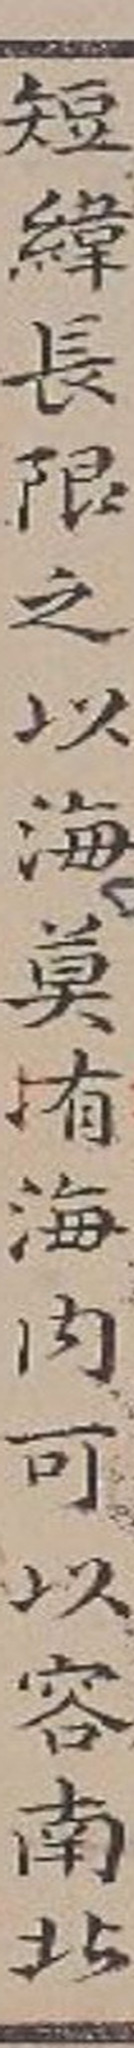短緯長限之以海。莫有海内可以容南北

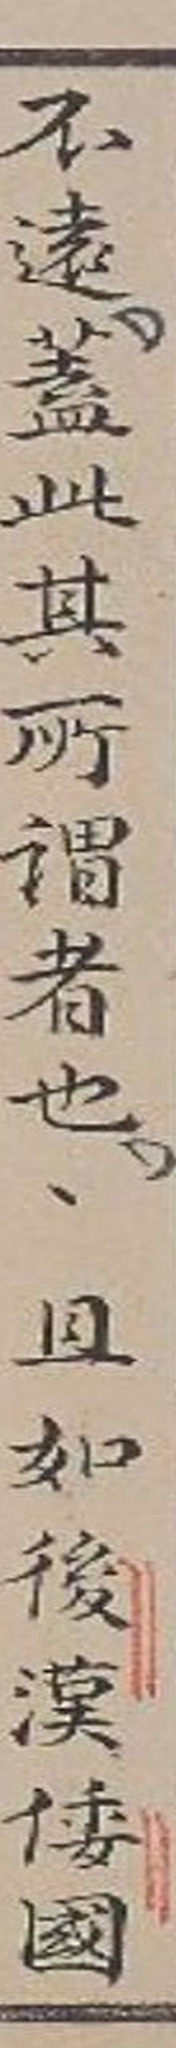不遠。蓋此其所謂者也。且如後漢倭国
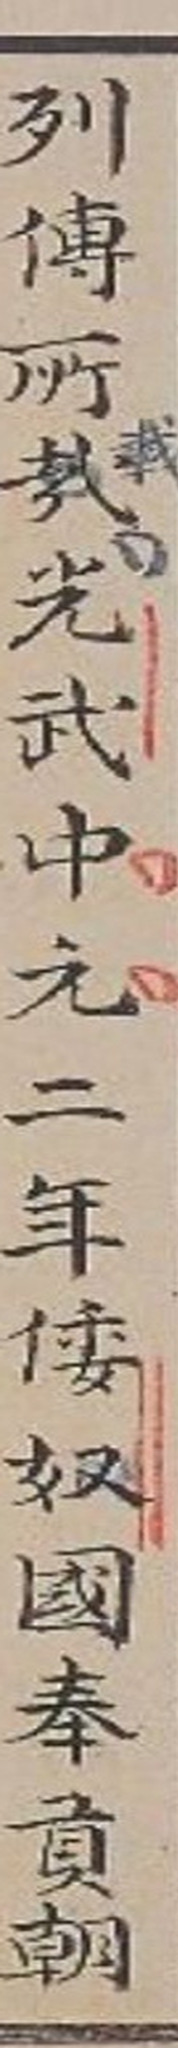列伝所哉載。光武中元二年倭奴国奉貢朝
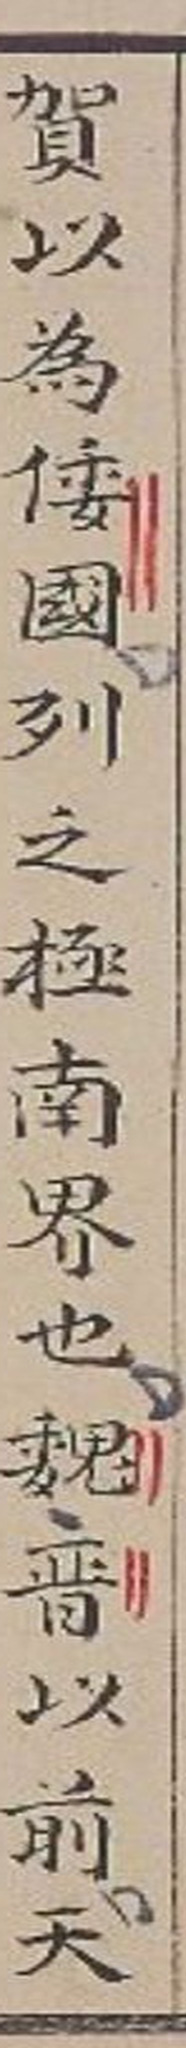賀以為倭国列之極南界也。魏・晋以前。天
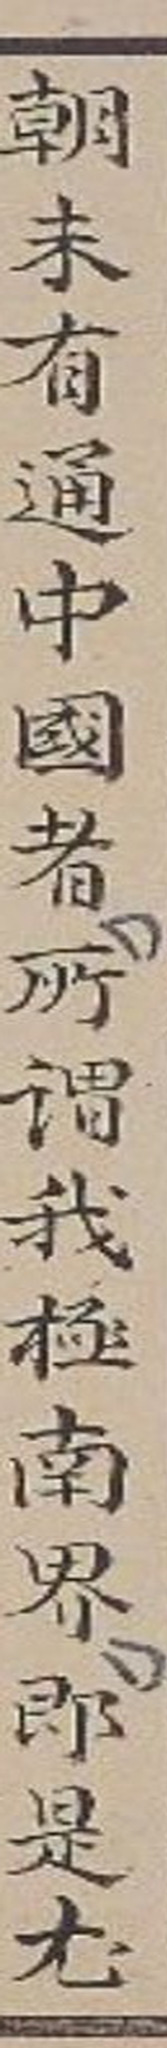朝未有通中国者。所謂我極南界。即是尤
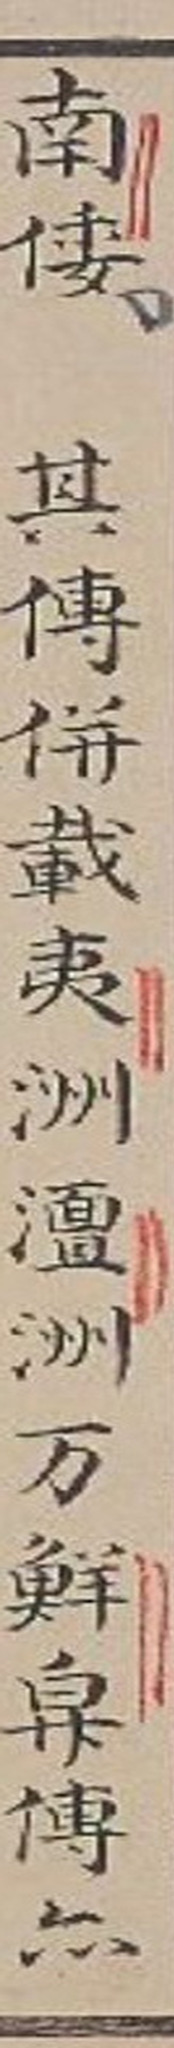南倭。其伝併載夷洲澶洲万鮮伝亦
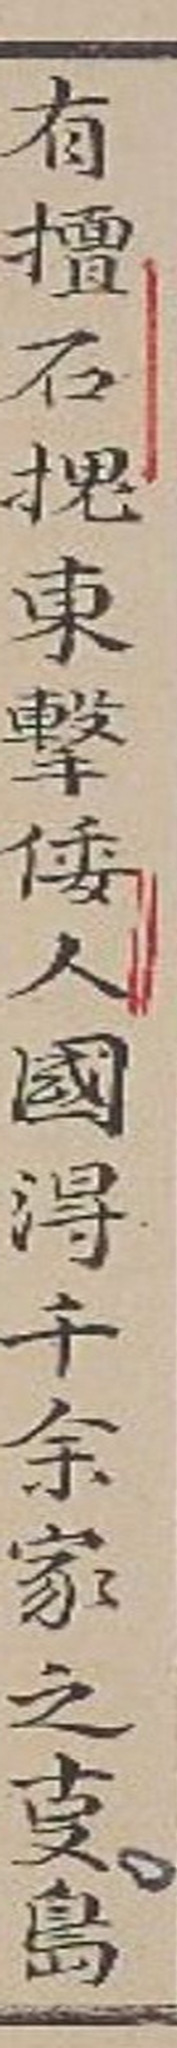有檀石槐東撃倭人国淂千余家之事。島
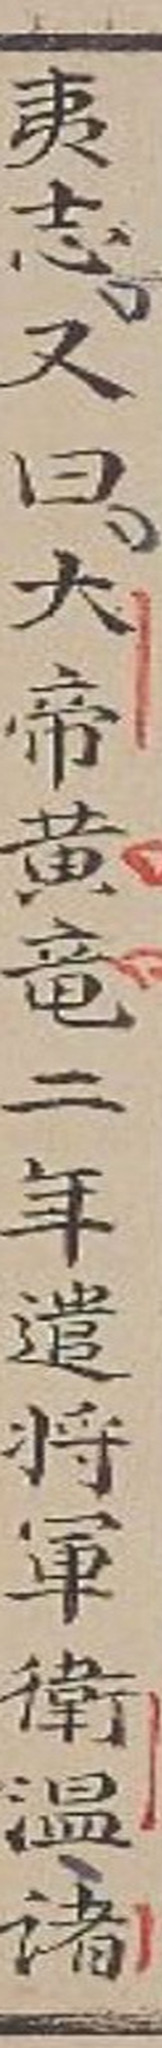夷志。又曰。大帝黄竜二年遣将軍衛温・諸
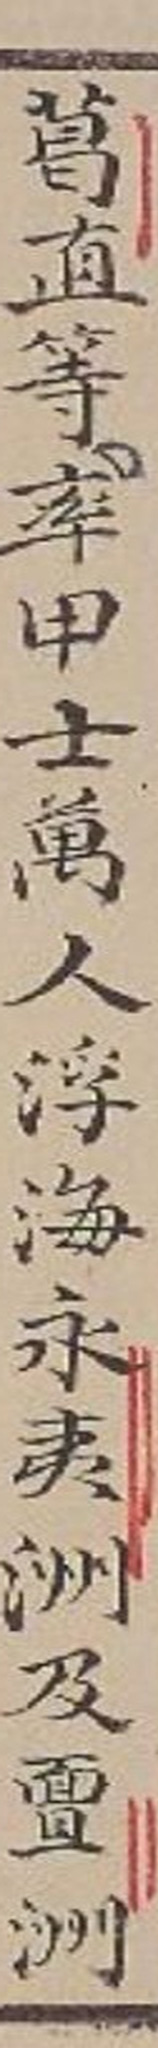葛直等。率甲士万人浮海永夷洲及亶洲
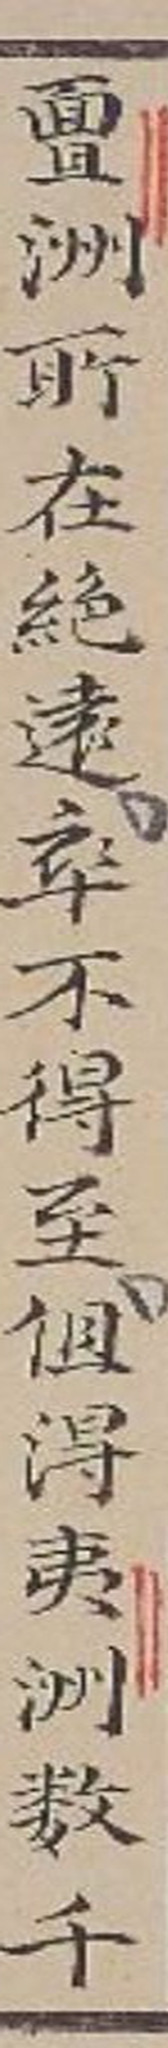亶洲所在絶遠。卒不得至。但淂夷洲数千
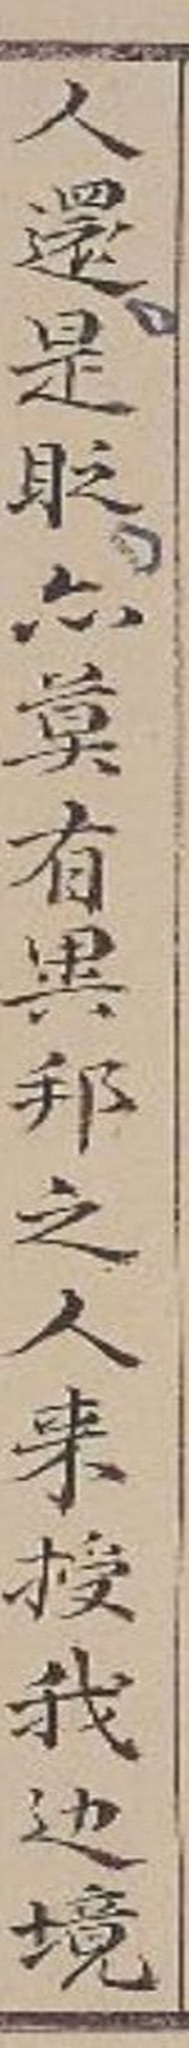人還。是時。亦莫有異邦之人来授我辺境
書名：南島志 全
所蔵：University of the Ryukyus Library
